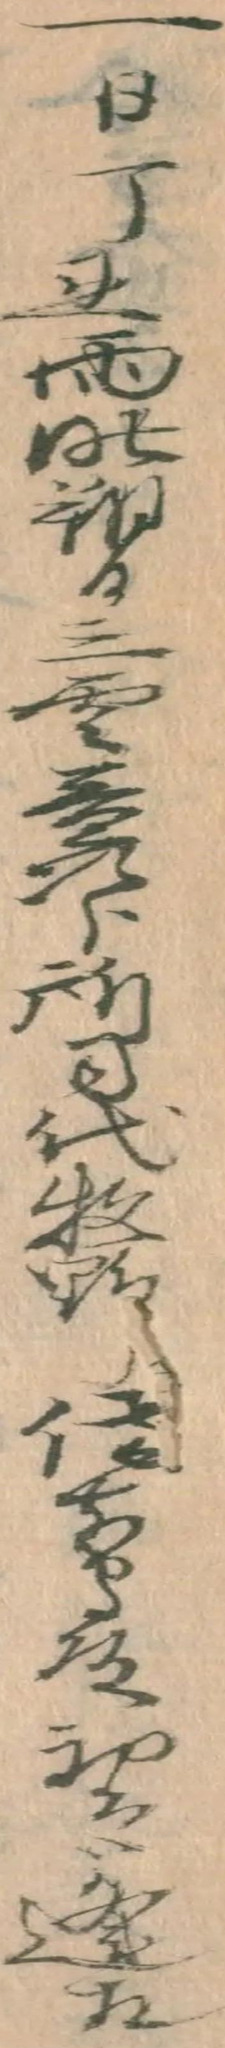二日丁丑雨昨朔日三雲善九郎所司代牧野備前守殿初而御逢相
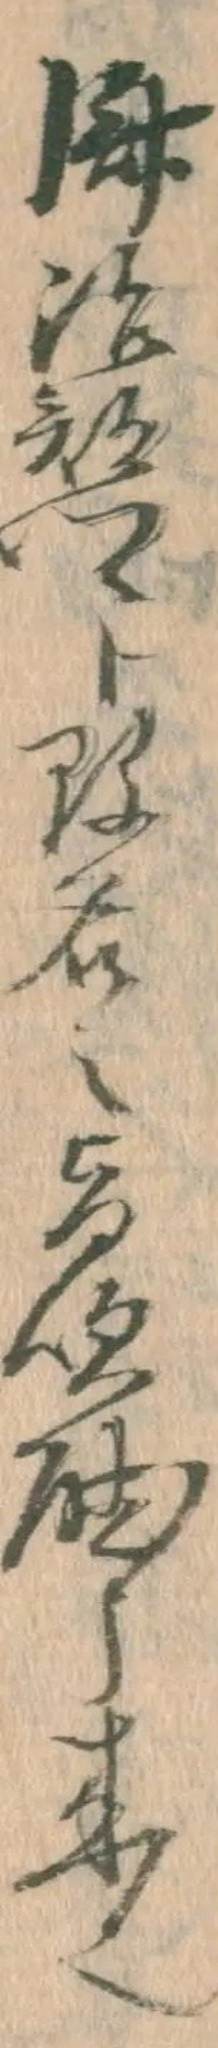済治部卿と改名之旨吹聴申来也
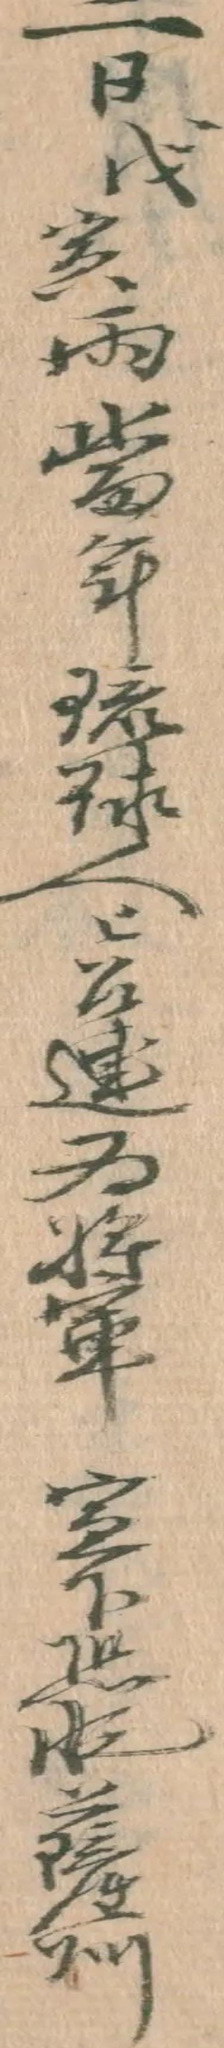三日戊寅雨當年琉球人被召連為将軍宣下恐悦薩州
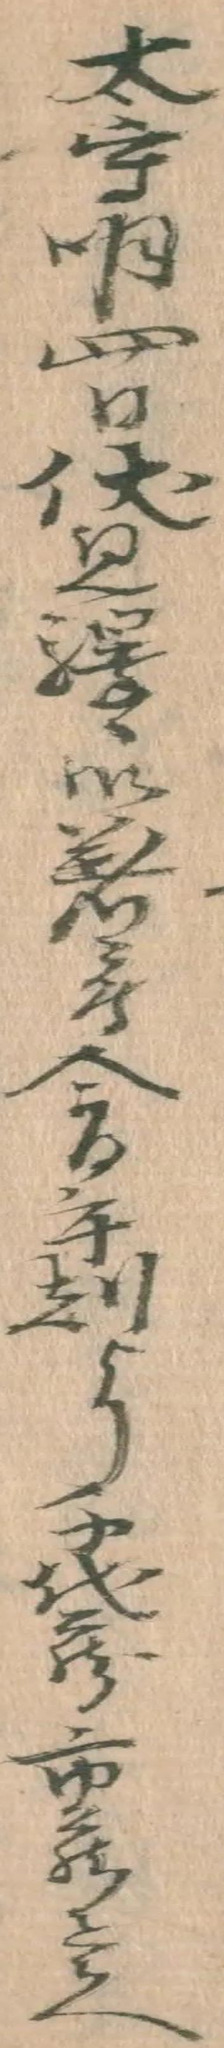太守明四日伏見驛へ御着ニ付今日午刻より千代蔵市蔵壱人
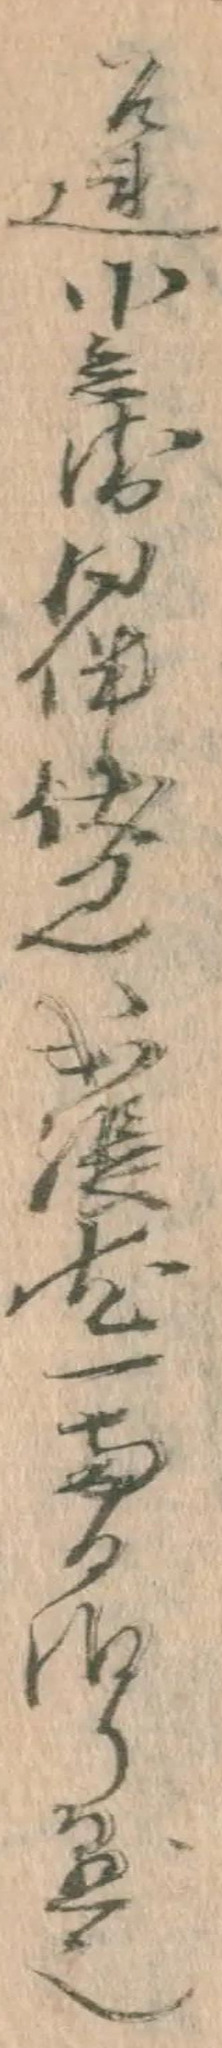召連小兵衛同伴伏見へ出張尤一両日泊り過也
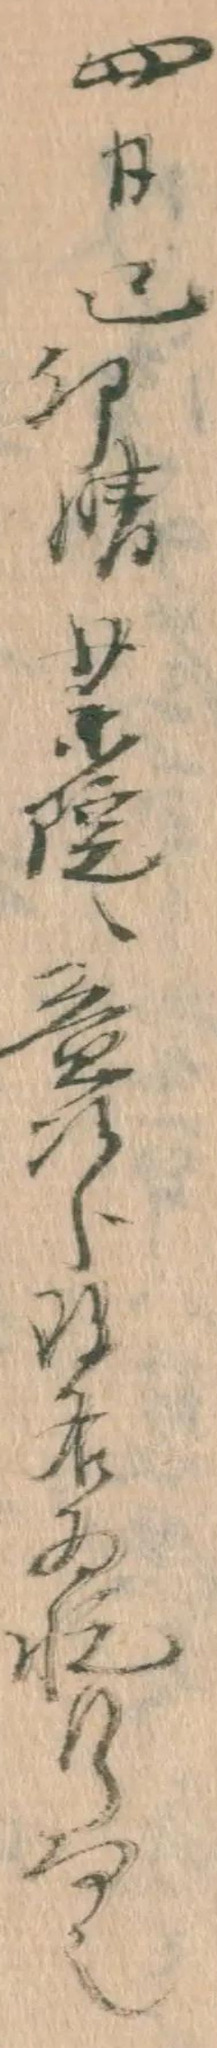四日己卯晴薬院へ益次郎会名為祝行向也
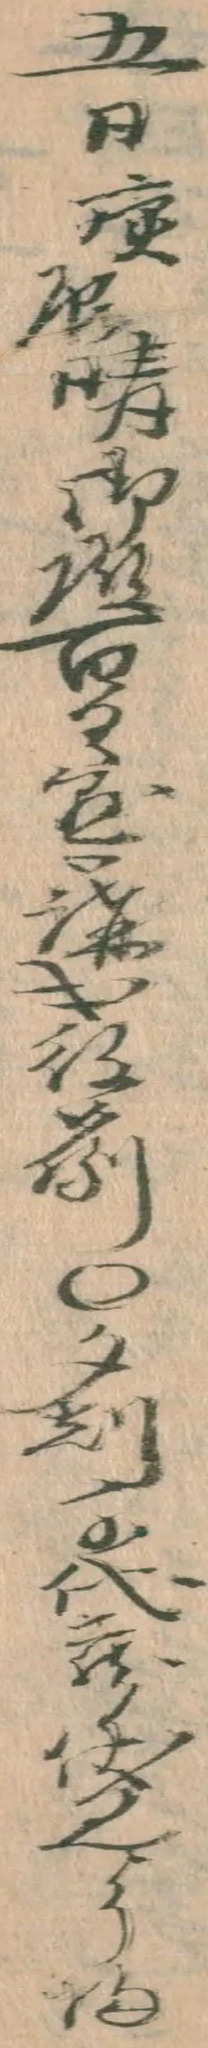五日庚戌晴御殿百匁懸御講出役如例〇夕刻千代蔵伏見より帰
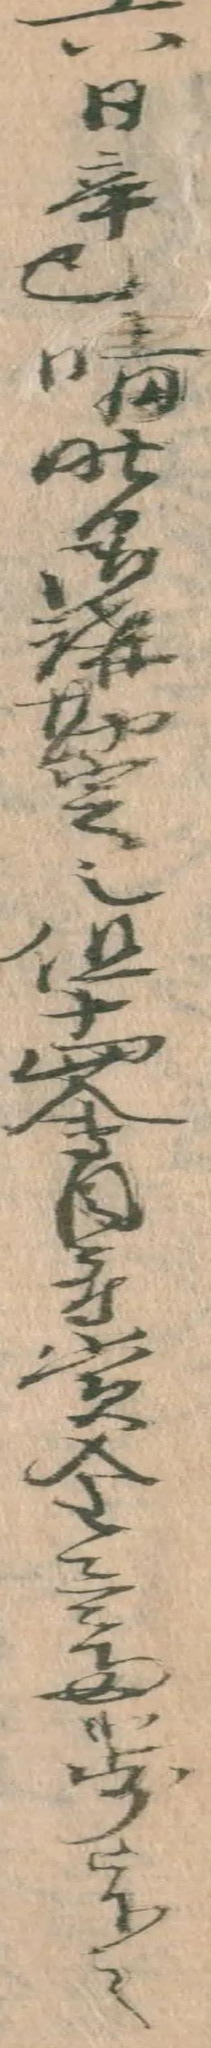六日辛巳晴昨日御講勘定也但十四會目二付賞金壱両弐歩被下也
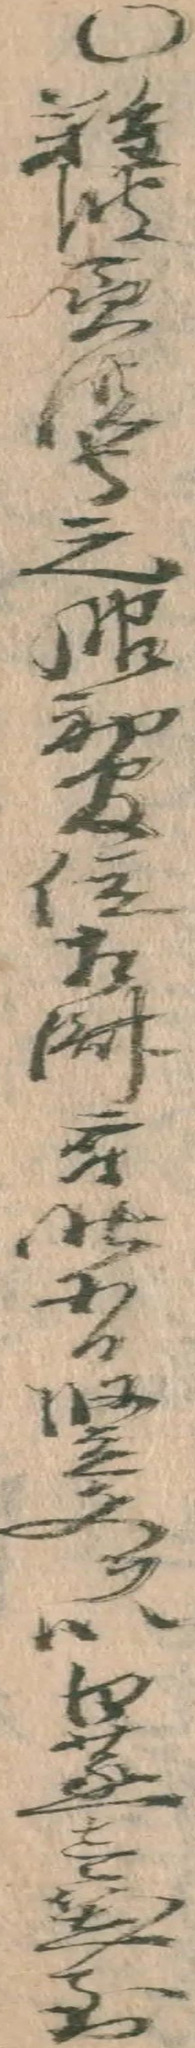○難波美濃守元服初官位相済ニ付昨五日堅文を以白蒸壱器到
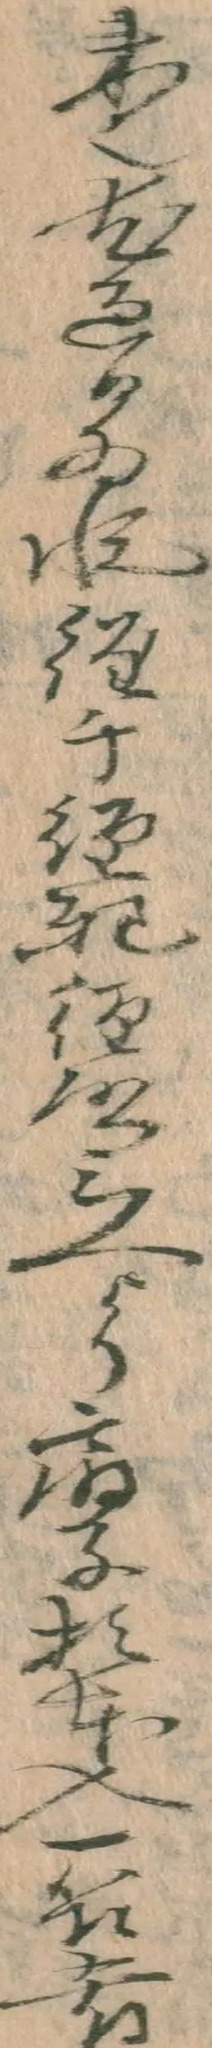来也尤過日為祝経千経紀経啓三人より扇子数本入一箱肴
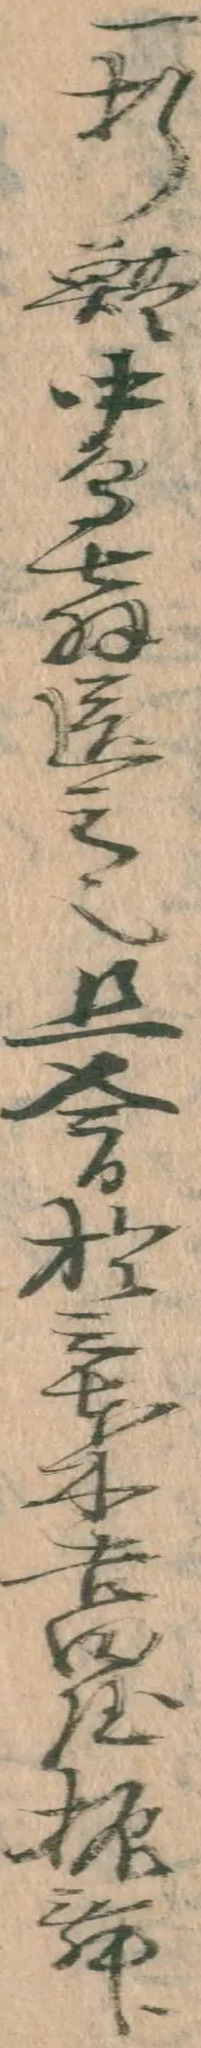一折鯵中鳥七羽送之也且今日於三本木吉田屋振舞
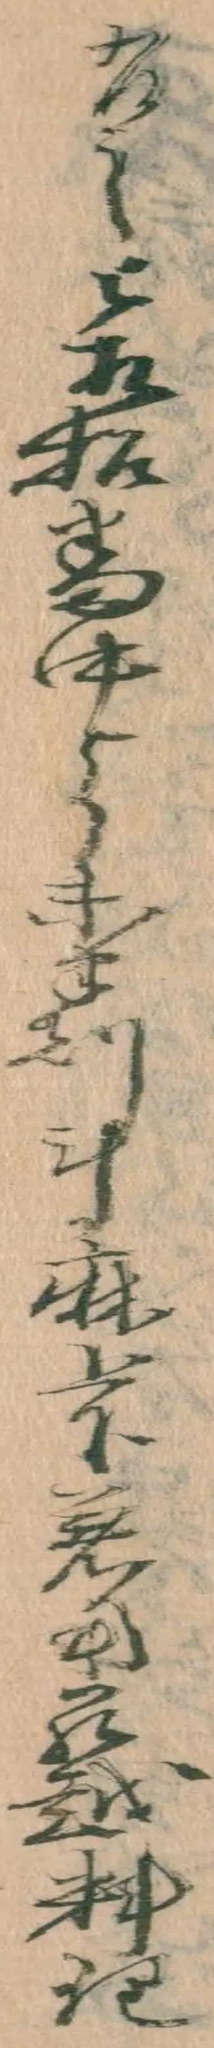有之被相招番中より未半刻斗麻上下着用罷越料理
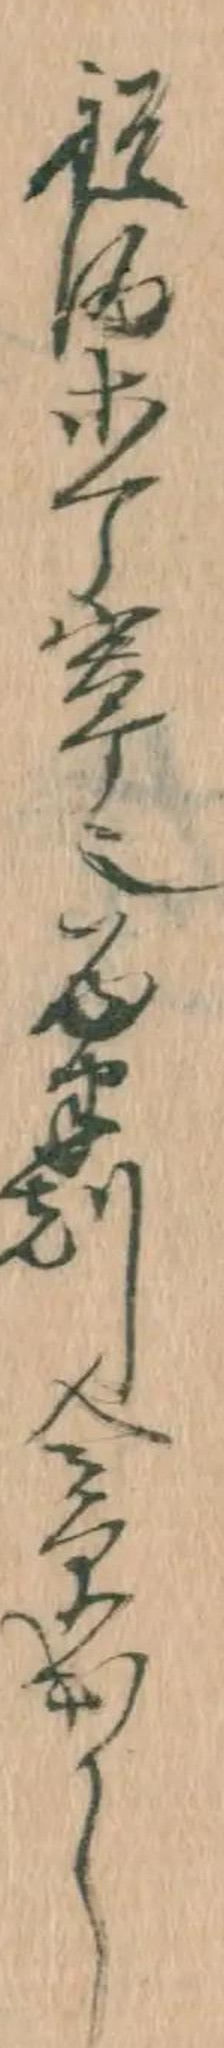祝酒等丁寧也酉半刻令早出也
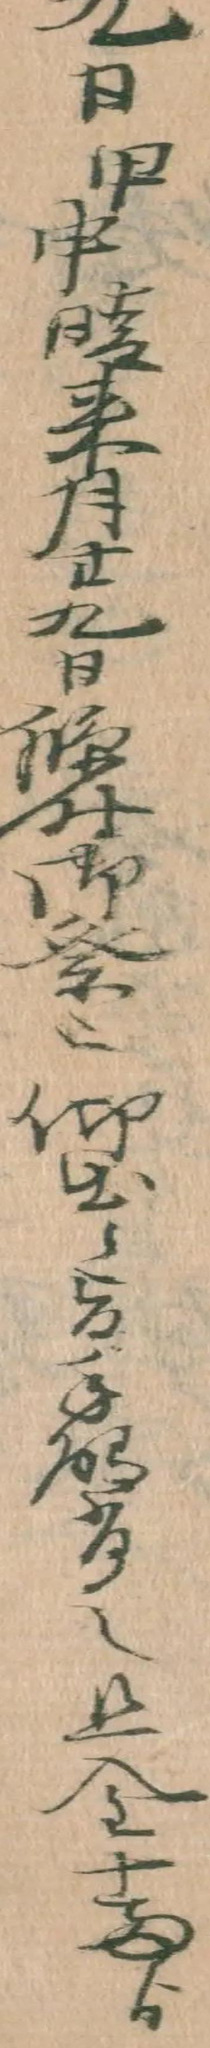九日甲申晴来月廿九日臨時御祭被仰出候旨手觸有之且金十両ゟ
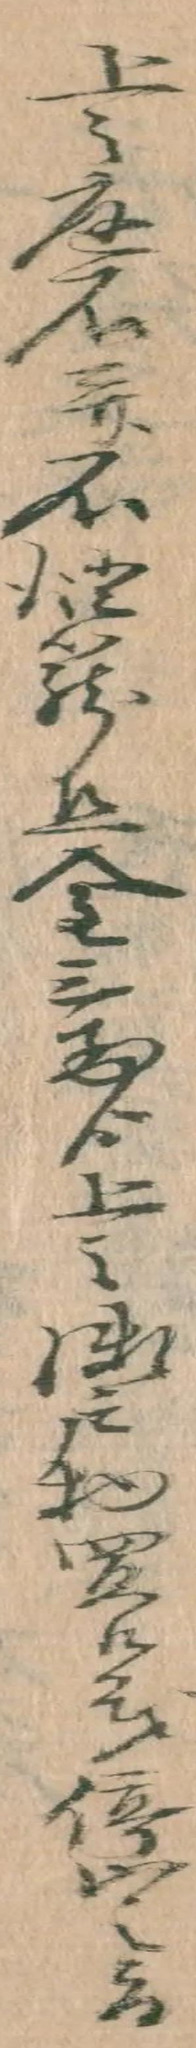上之庭石幷石燈籠且金三両ゟ上之御戸物買候義停止之旨
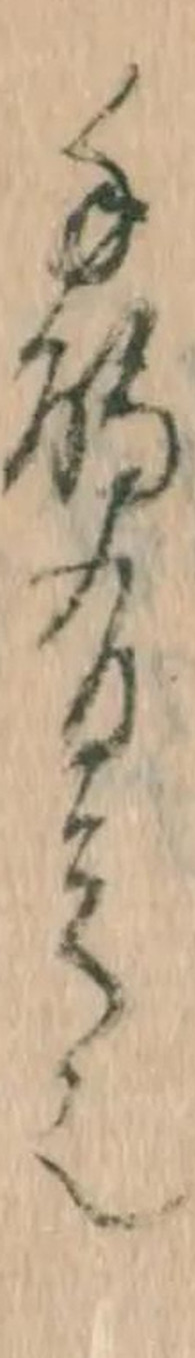手觸有之也
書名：賀茂社記録. 第69冊
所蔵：国立国会図書館 National Diet Library, JAPAN
